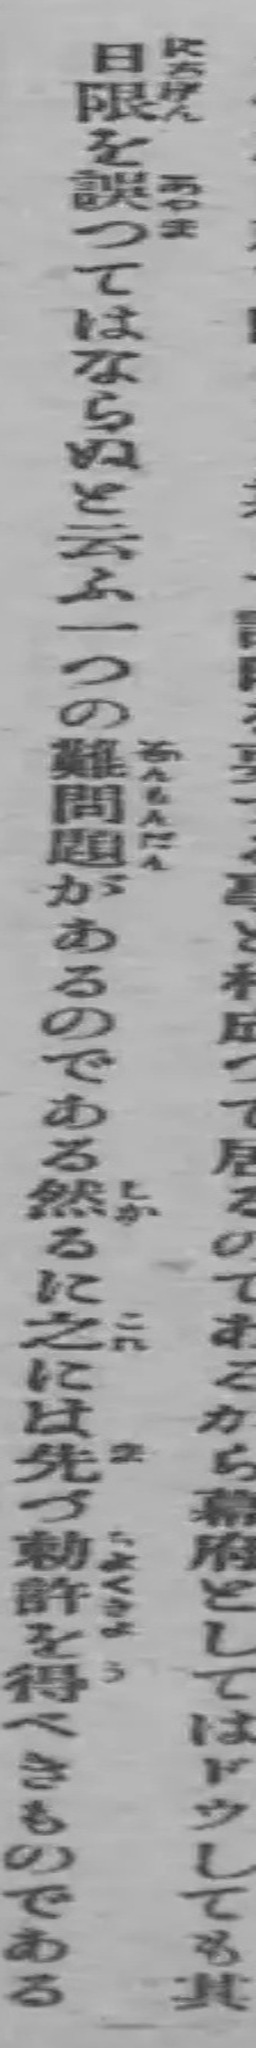日限を誤つてはならぬと云ふ一つの難問題があるのである然るに之には先づ勅許を得べきものである
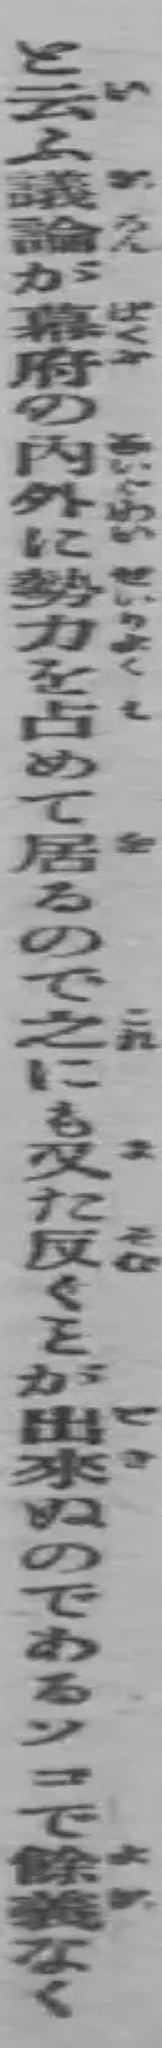と云ふ議論が幕府の内外に勢力を占めて居るので之にも又た反くことが出来ぬのであるソコで余義なく
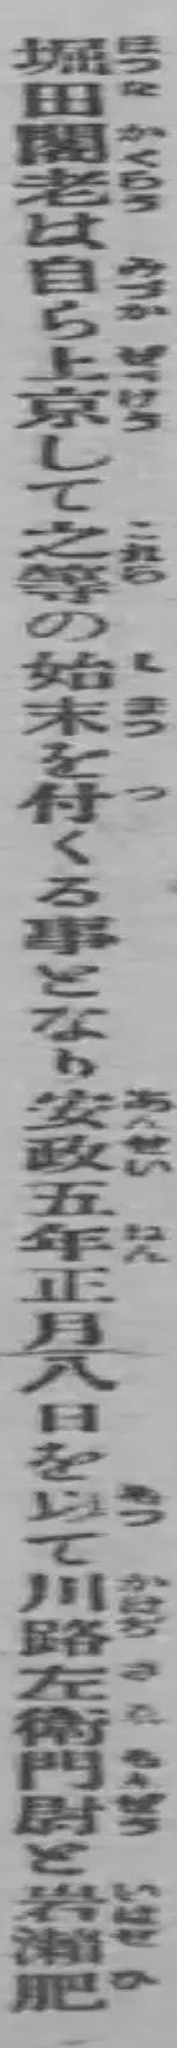堀田閣老は自ら上京して之等の始末を付くる事となり安政五年正月八日を以て川路左衛門尉と岩瀬肥
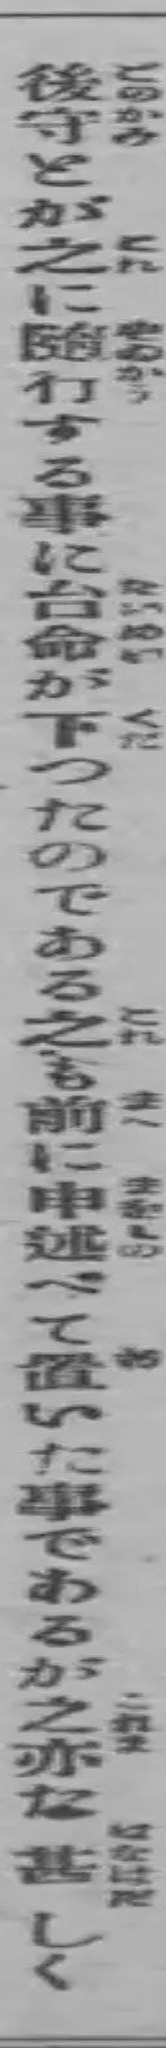後守とが之に随行する事に台命が下つたのでる之も前に申述べて置いた事であるが之亦た甚しく
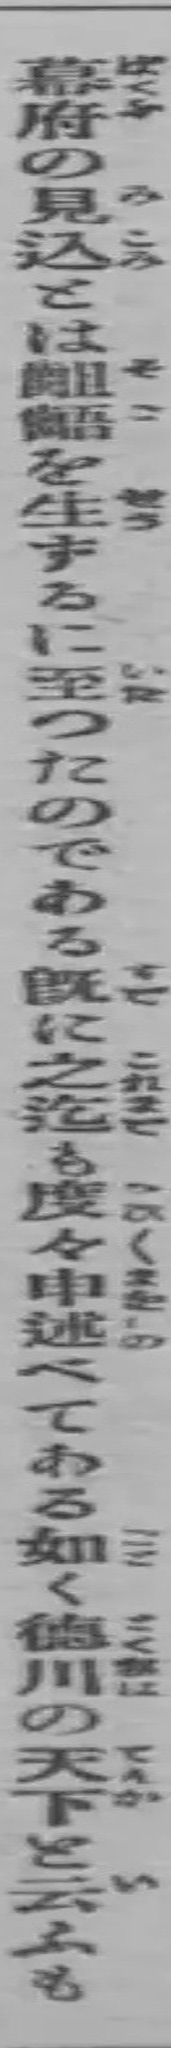幕府の見込とは齟齬を生ずるに至つたのである既に之迄も度々申述べてある如く徳川の天下と云ふも
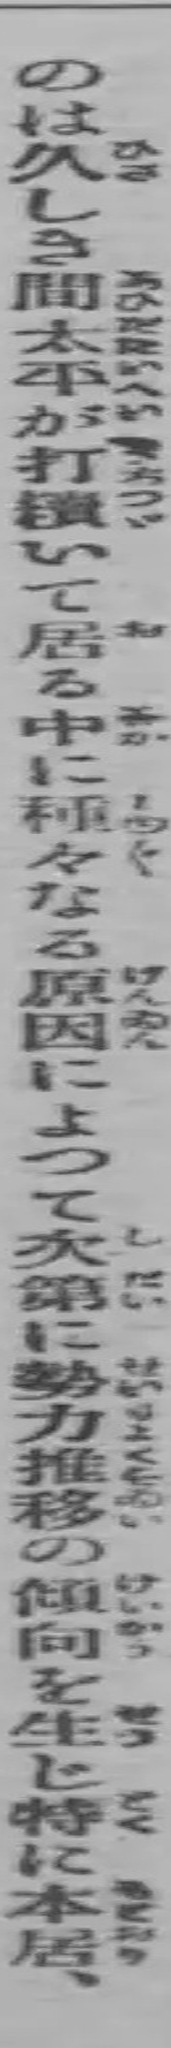のは久しき間太平が打続いて居る中に種々なる原因によつて次第に勢力推移の傾向を生じ特に本居、
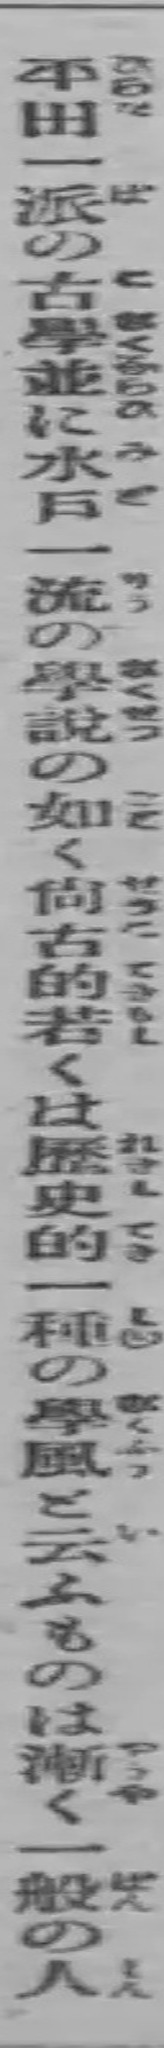平田一派の古学並に水戸一流の学説の如く尚古的若くは歴史的一種の学風と云ふものは漸く一般の人
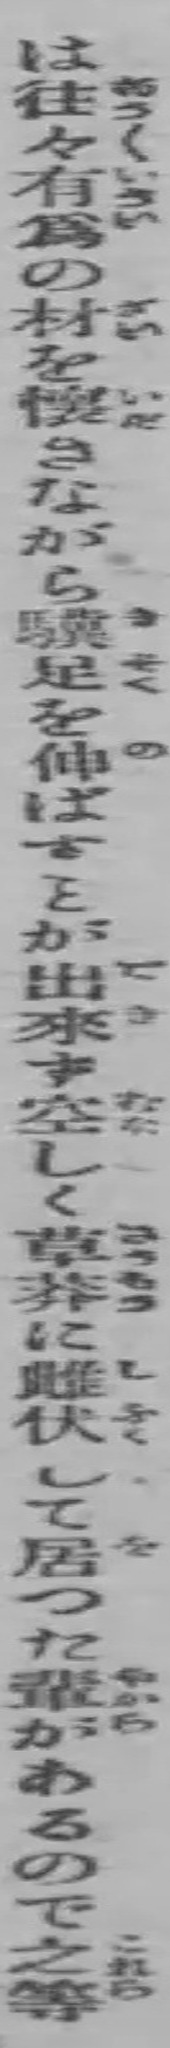は往々有為の材を懐きながら驥足を伸ばすことが出来ず空しく草莽に雌伏して居つた輩があるので之等
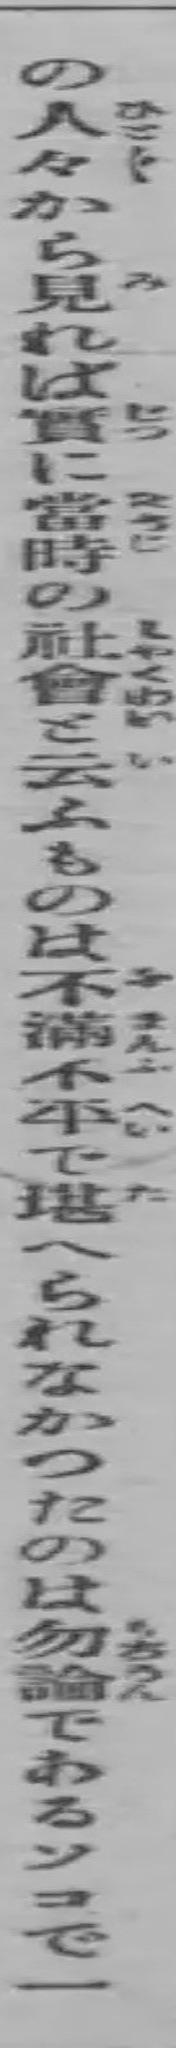の人々から見れば実に当時の社会と云ふものは不満不平で堪へられなかつたのは勿論であるソコで一
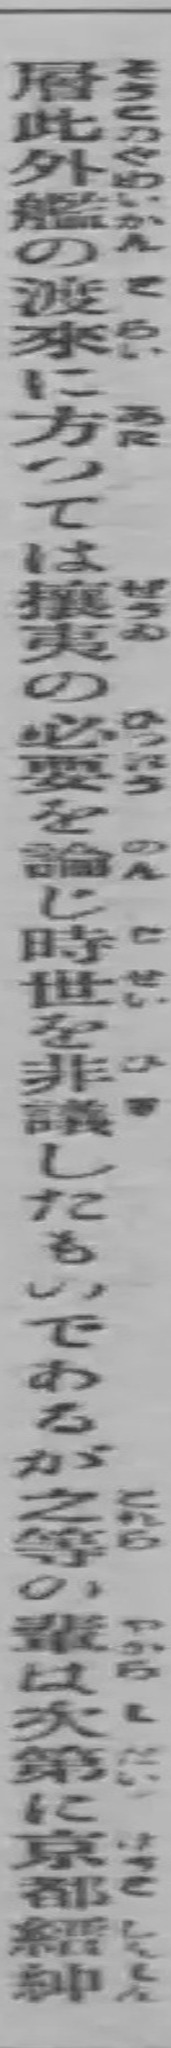層此外艦の渡来に方つては攘夷の必要を論じ時世を非議したものであるが之等の輩は次第に京都縉紳
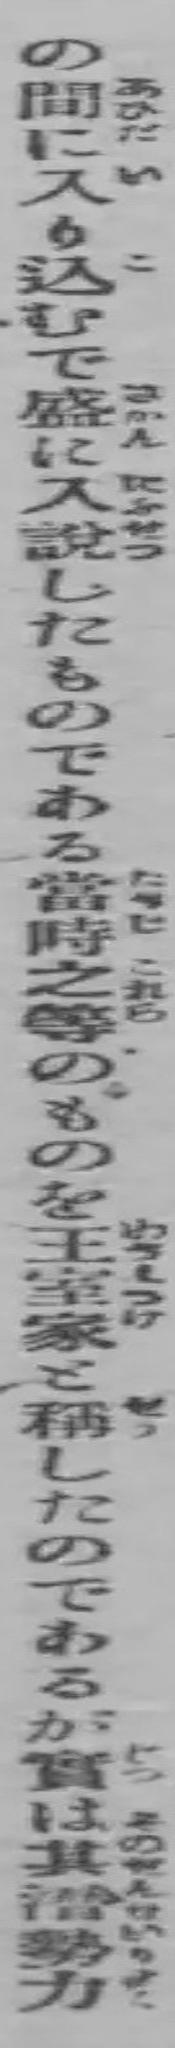王室家の間に入り込むで盛に入説したものである当時之等のものを王室家と称したのであるが実は其潜勢力
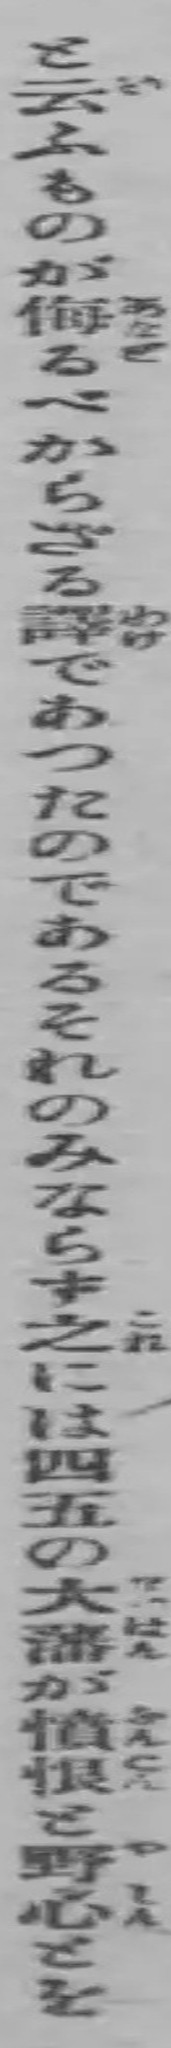と云ふものが侮るべからざる訳であつたのであるそれのみならず之には四五の大藩が憤恨と野心とを
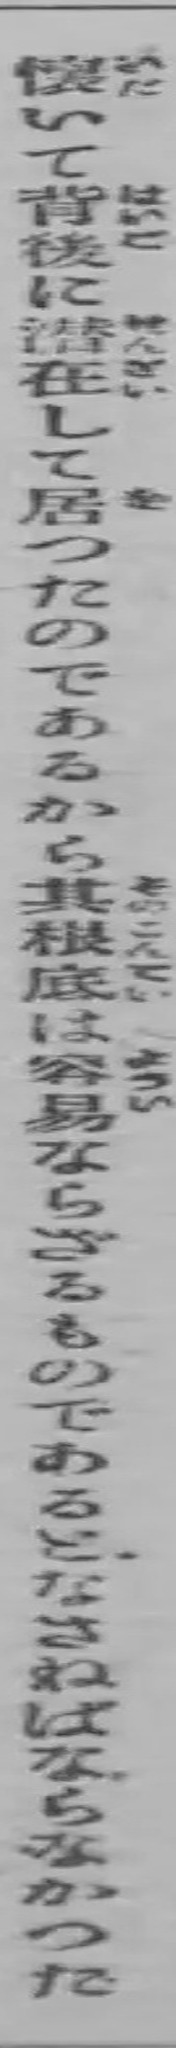懐いて背後に潜在して居つたのであるから其根底は容易ならざるものであるとなさねばならなかつた
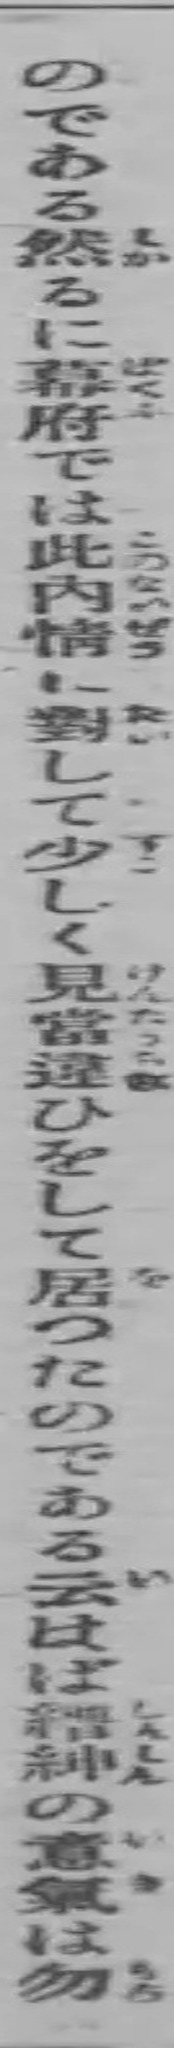のである然るに幕府では此内情に対して少しく見当違ひをして居つたのである云はば縉紳の意気は勿
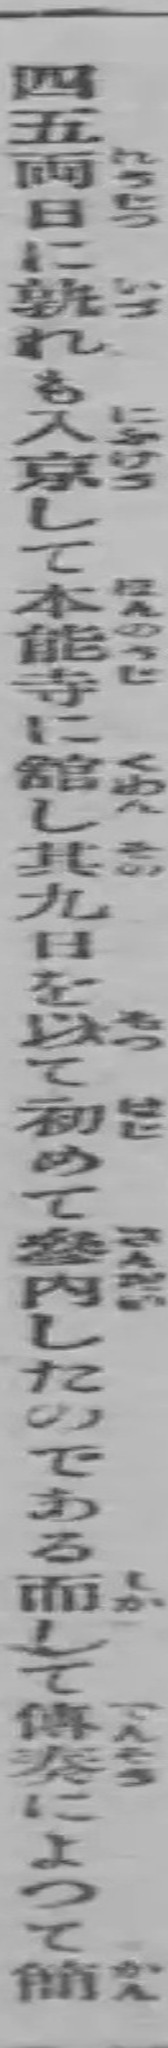四五両日に孰れも入京して本能寺に館しその九日を以て初めて参内したのである而して伝奏によつて簡
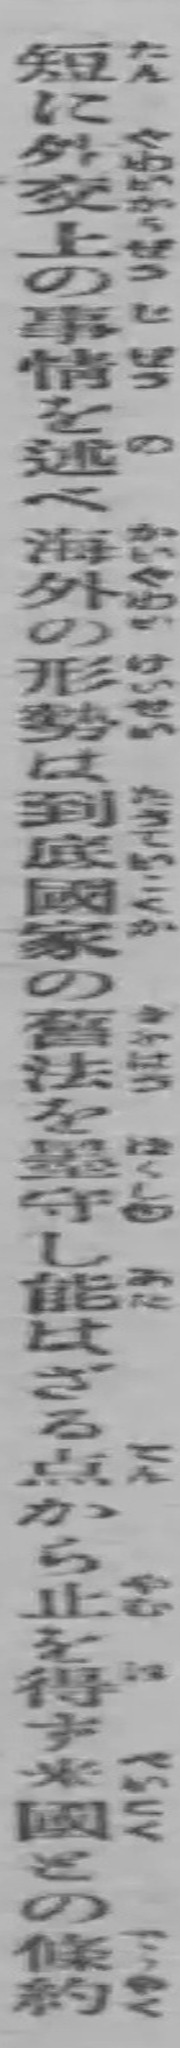短に外交上の事情を述べ海外の形勢は到底国家の旧法を墨守し能はざる点から止を得ず米国との条約
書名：豊橋市史談
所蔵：国立国会図書館 National Diet Library, JAPAN
